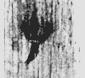十
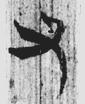又
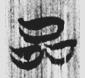厽（三）
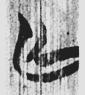亡
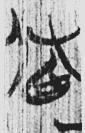○（僕）
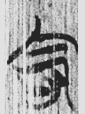命（令）
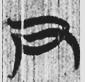尹
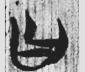曰
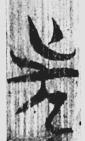先
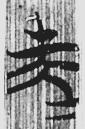夫
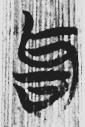○（嗣）
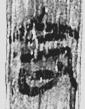命（令）
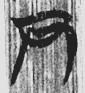尹
